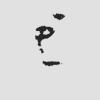𠁩
